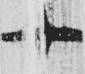七
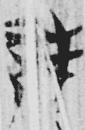邦
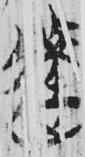○（來）
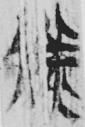備（服）
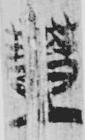豐
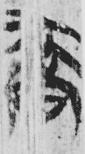喬（鎬）
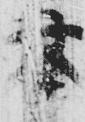不
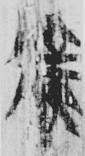備（服）
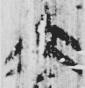文
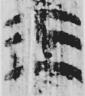王
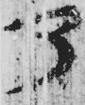乃
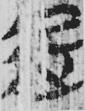○（起）
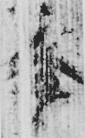帀（師）
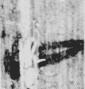㠯（以）
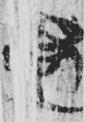鄉（嚮）
